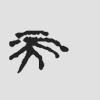天
